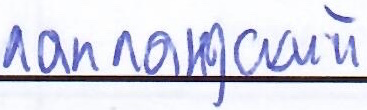лапландский
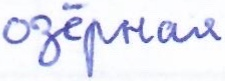озёрная
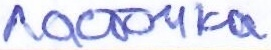ласточка
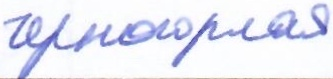черногорлая
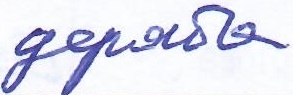деряба
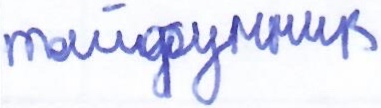тайфунник
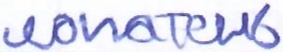лопатень
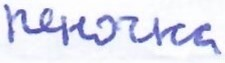пеночка
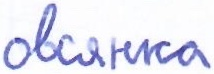овсянка
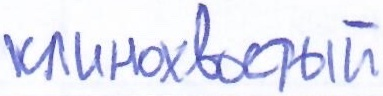клинохвостый
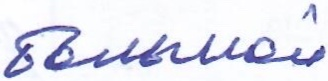большой
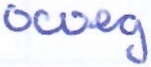осоед
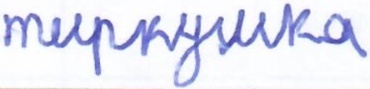тиркушка
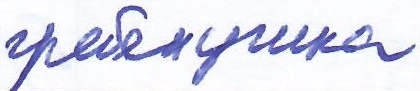гребенушка
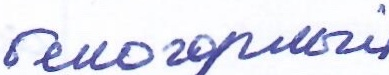белогорлый
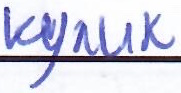кулик
